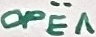орёл
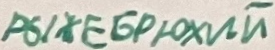рыжебрюхий
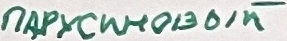парусиновый
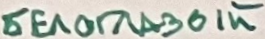белоглазый
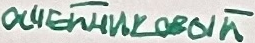ошейниковый
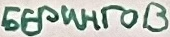берингов
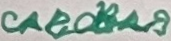садовая
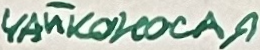чайконосая
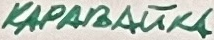каравайка
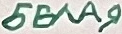белая
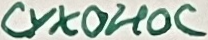сухонос
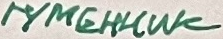гуменник
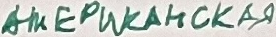американская
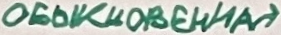обыкновенная
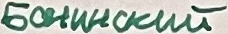бонинский
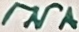гага
